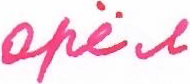орёл
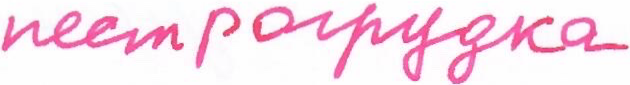пестрогрудка
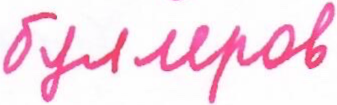буллеров
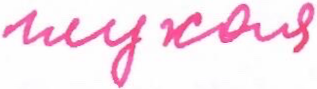глухая
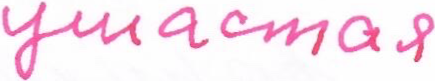ушастая
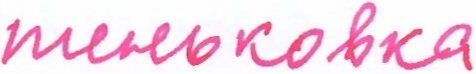теньковка
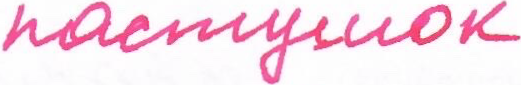пастушок
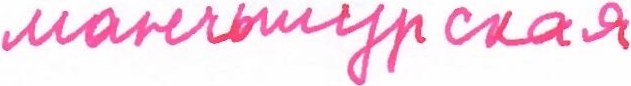манчьжурская
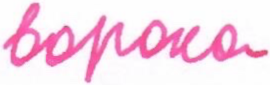ворона
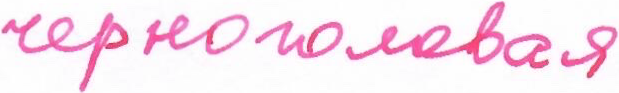черноголовая
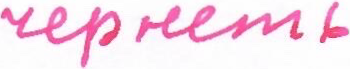чернеть
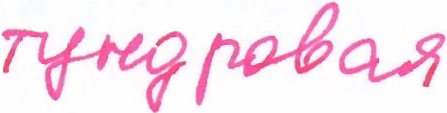тундровая
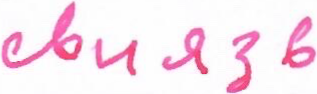свиязь
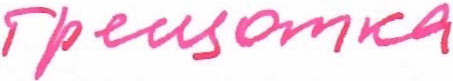трещотка
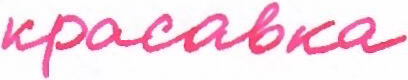красавка
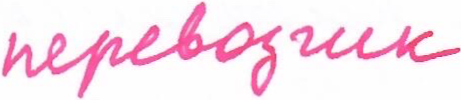перевозчик
